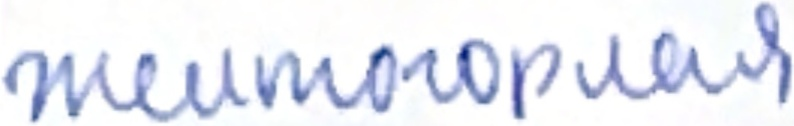желтогорлая
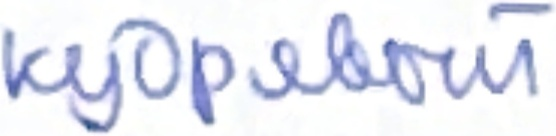кудрявый
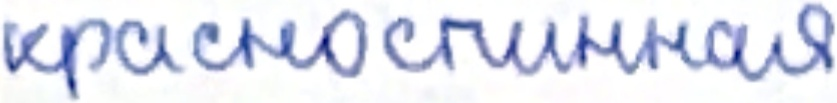красноспинная
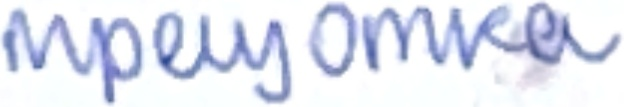трещотка
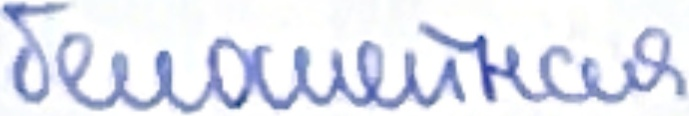белошейная
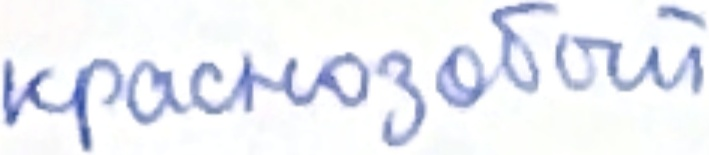краснозобый
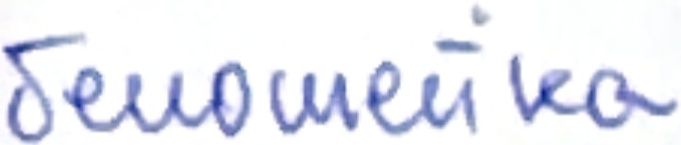белошейка
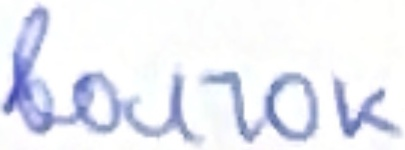волчок
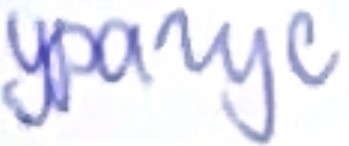урагус
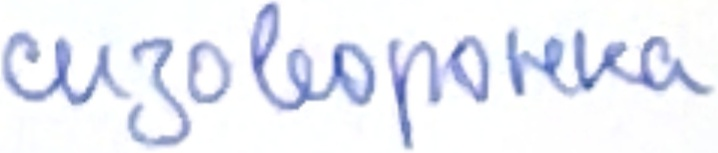сизоворонка
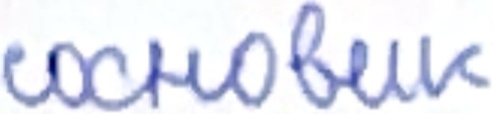сосновик
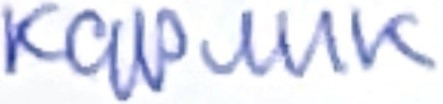карлик
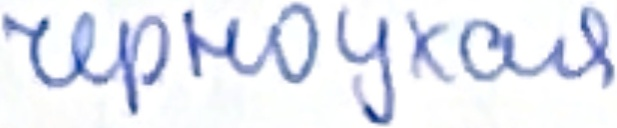черноухая
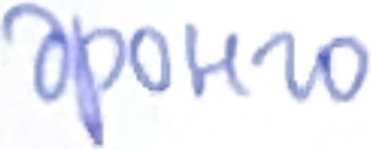дронго
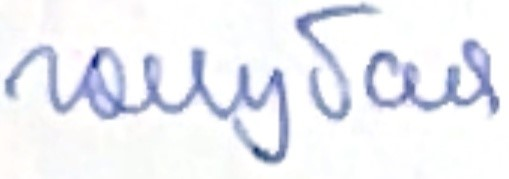голубая
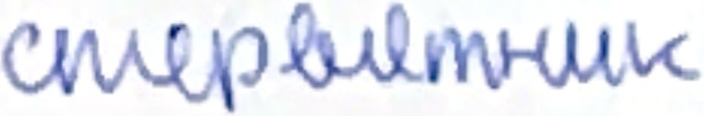стервятник
